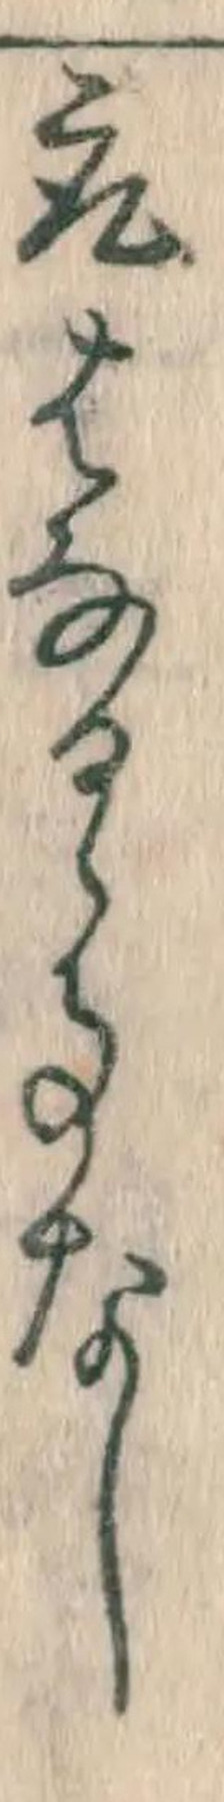取はなるゝ事なし
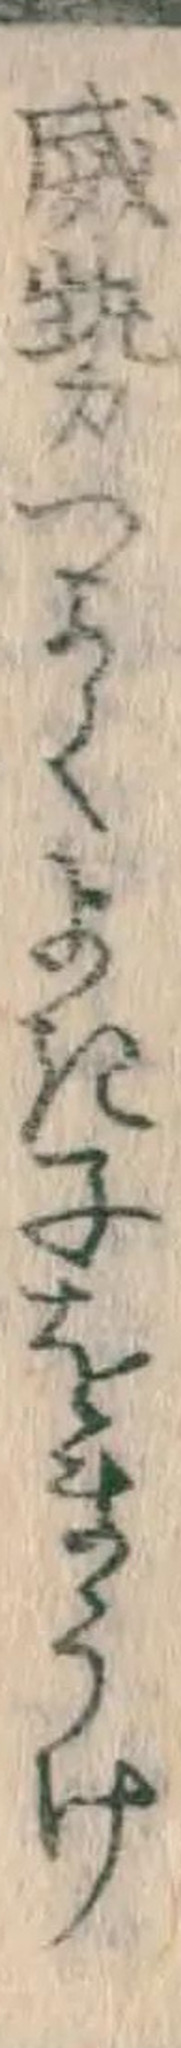威勢つよくよき子をまうけ
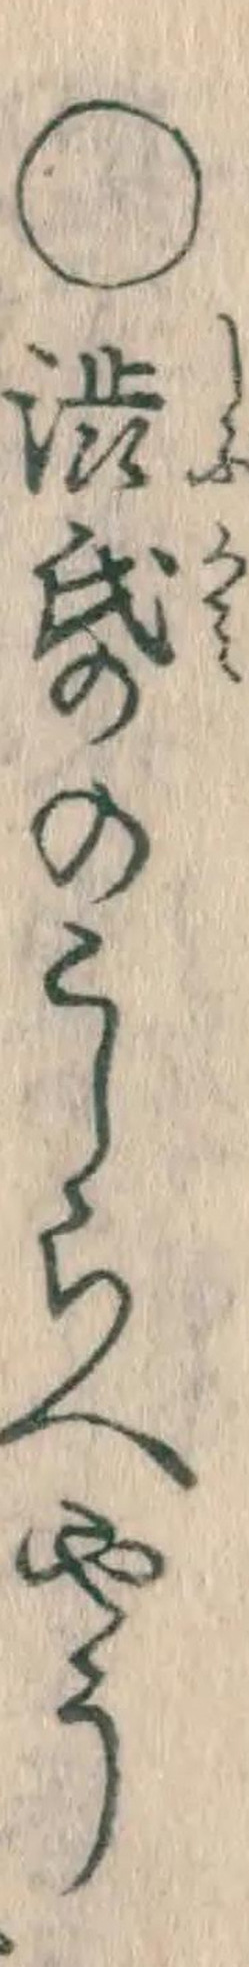○渋紙のこしらへやう
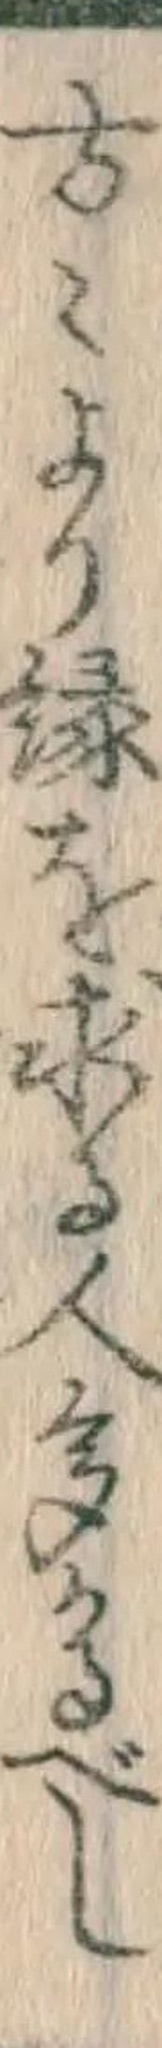方々より縁を求る人多かるべし
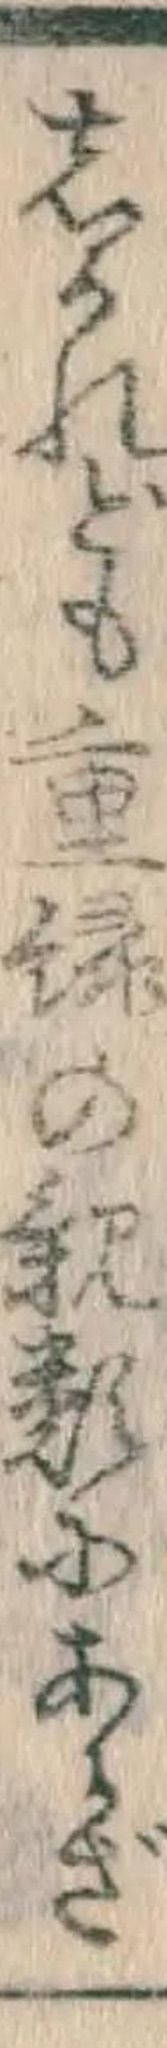しかれども重縁の親類にあらざ
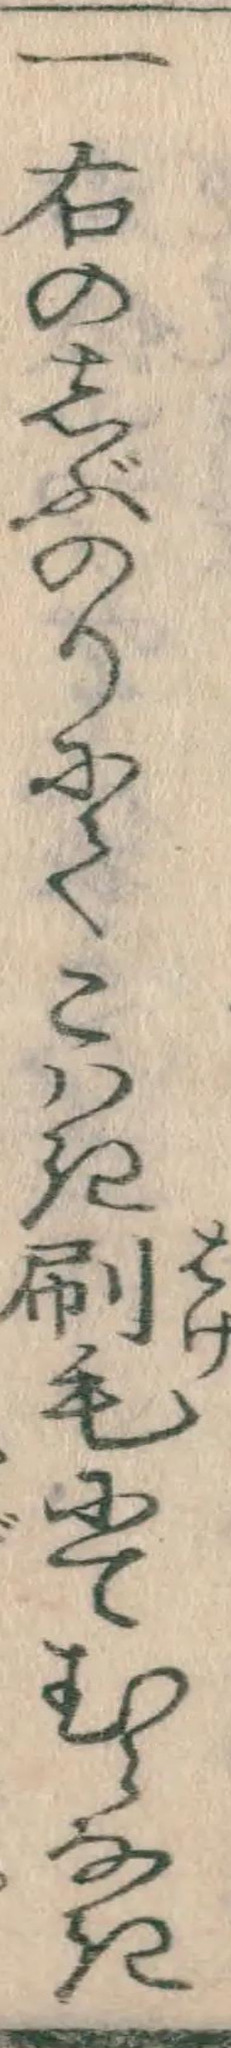一右のしぶのりにてこはき刷毛にてむらなき
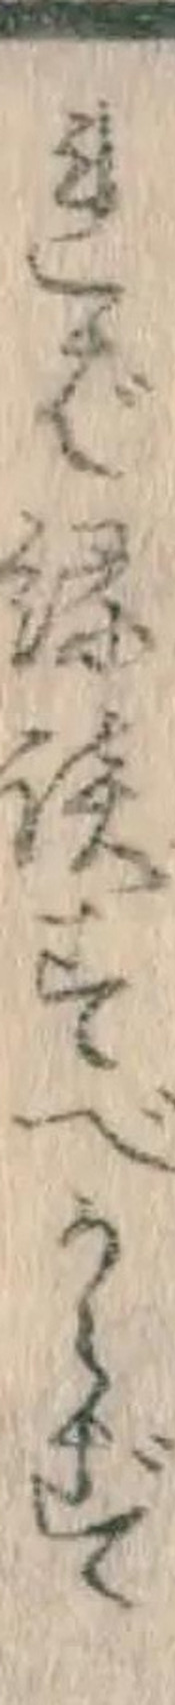れば縁談すべからず
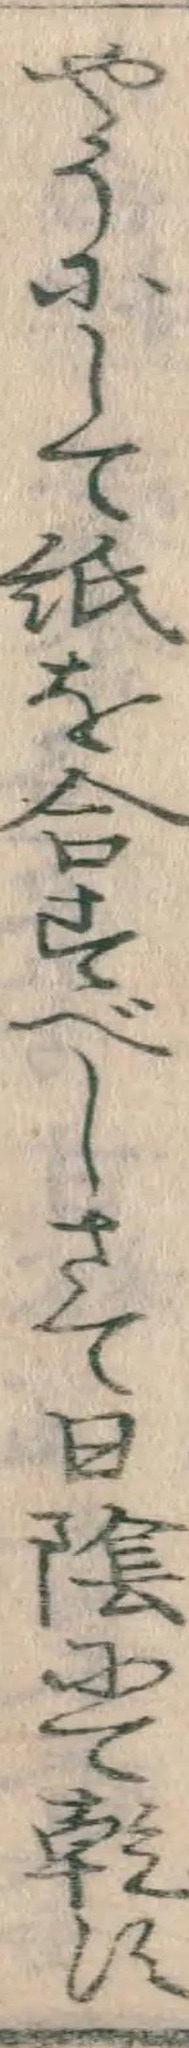やうにして紙を合すべしさて日陰にて乾す
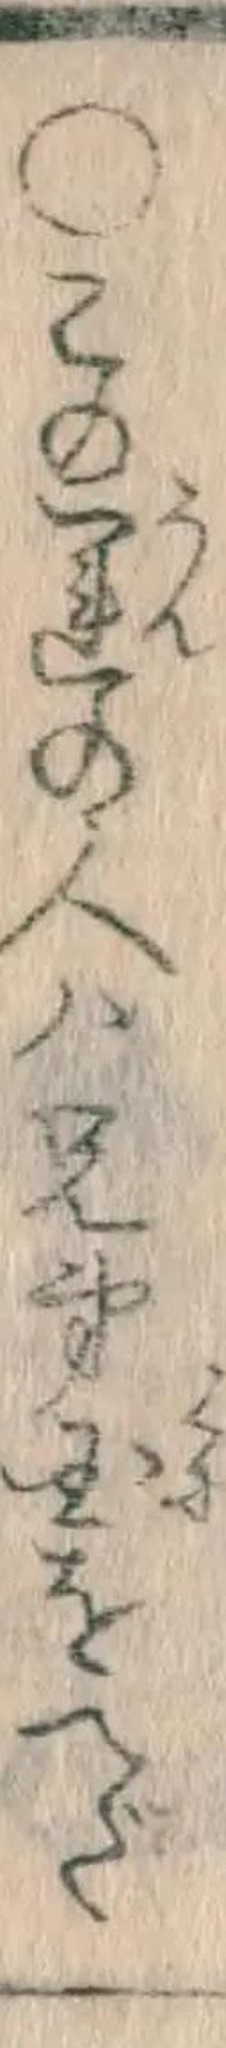○この運の人は兄弟国をへだ
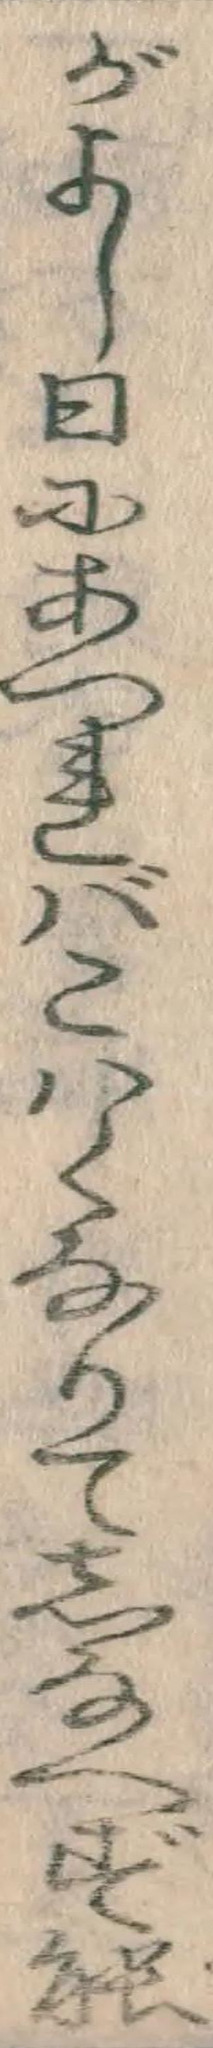がよし日にあつればこはくなりてしなへず能
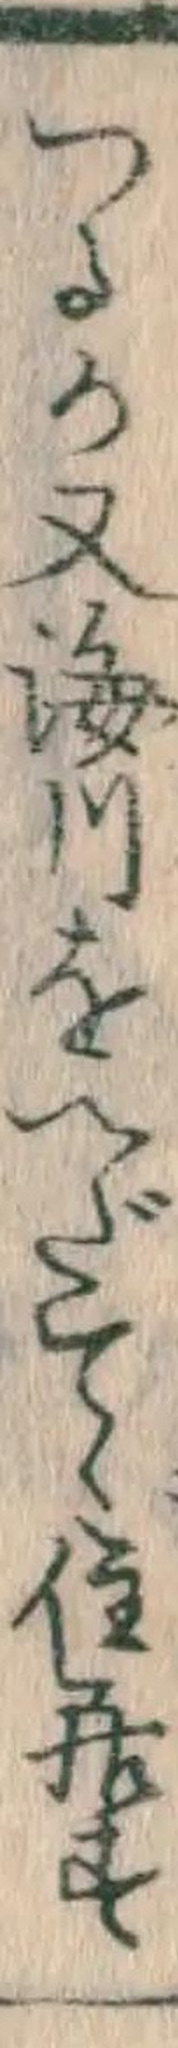つるか又海川をへだてゝ住居す
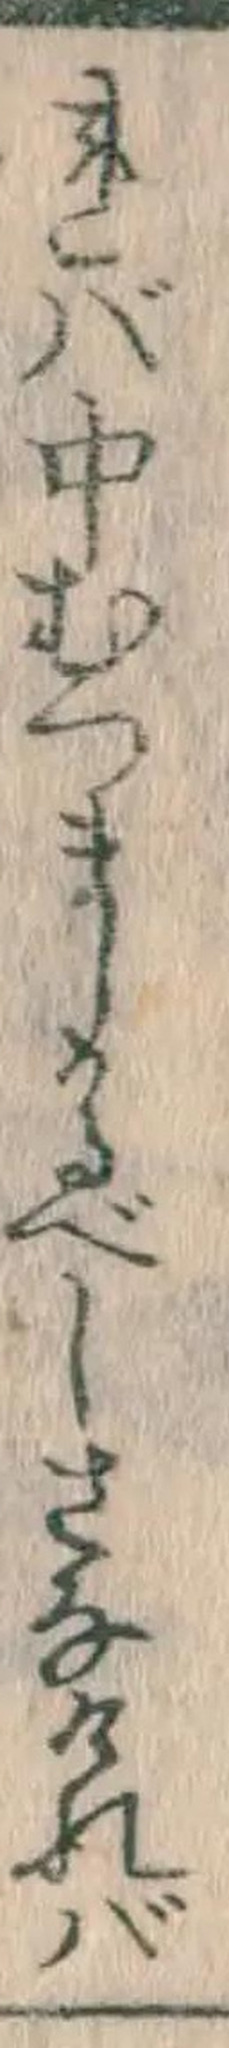れば中むつましかるべしさなければ
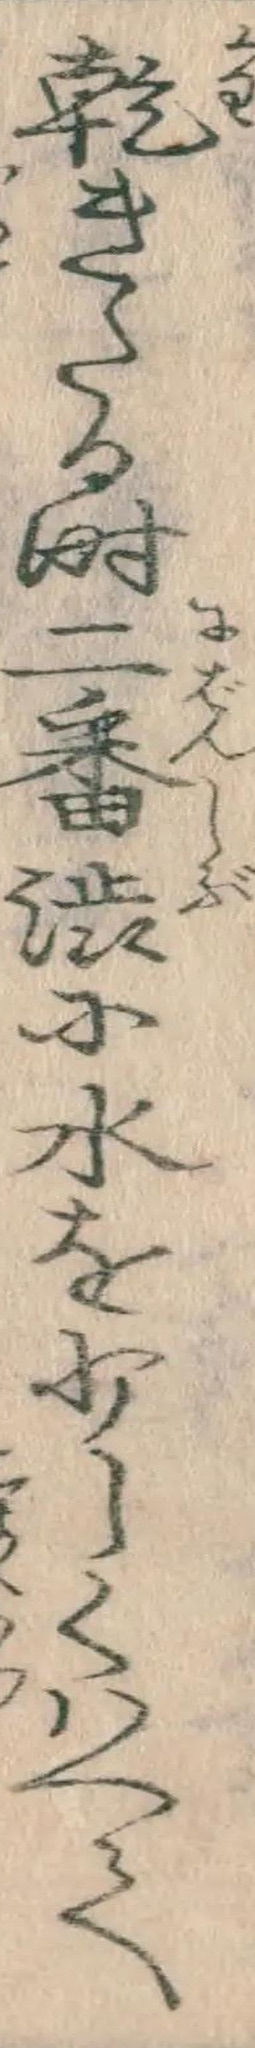乾きたる時二番渋に水を少しくはへて
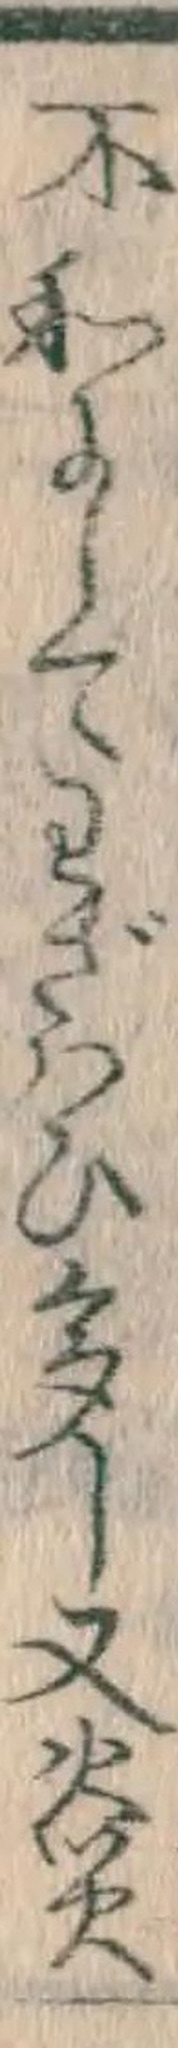不和にしてわざはひ多し又火災
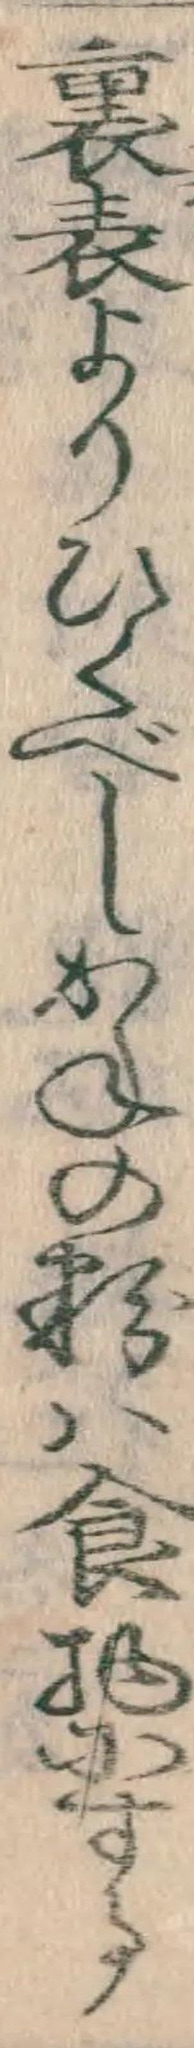裏表よりひくべしかねの粉は食物にする
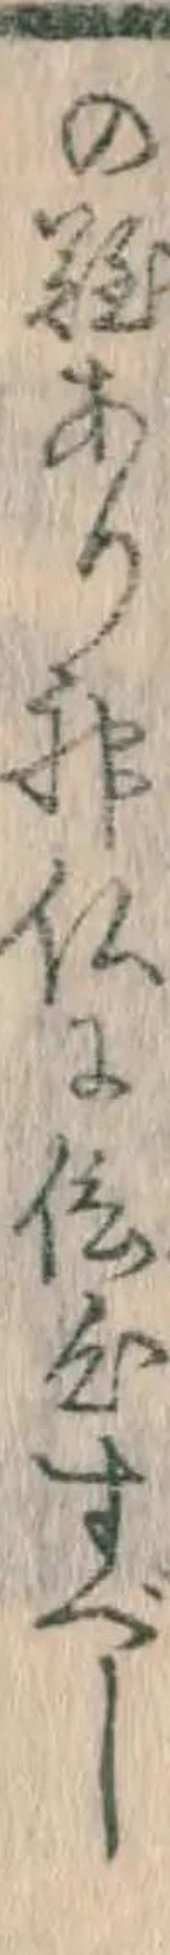の難あり神仏に信心すべし
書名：広益秘事大全 3巻. [2]
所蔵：国立国会図書館 National Diet Library, JAPAN
